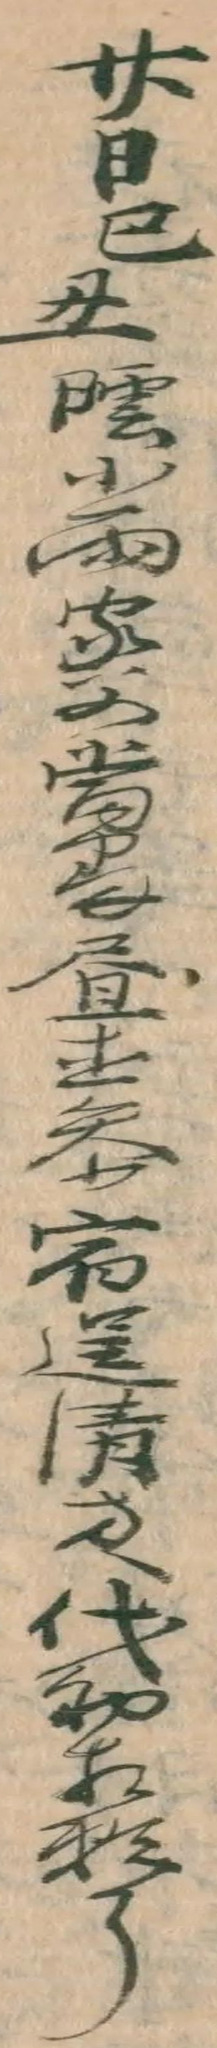廿日己丑晴小雨家父當番昼直参宿逞清方へ代勤相頼了
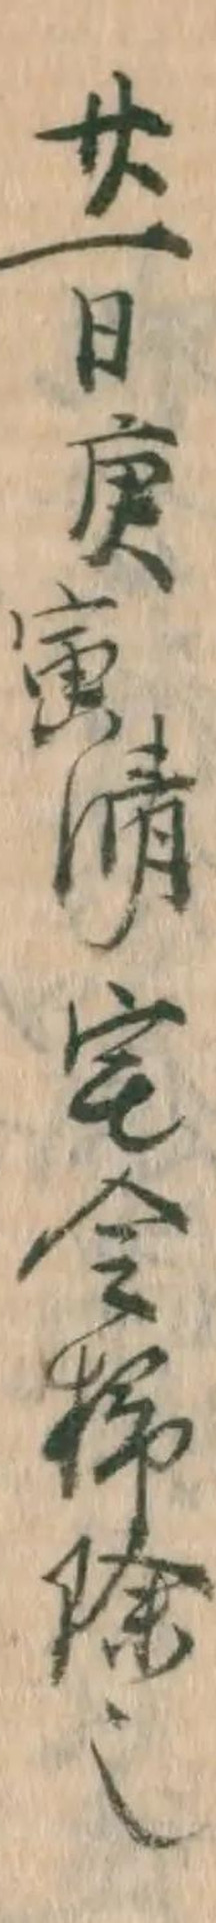廿一日庚寅晴宅令掃除也
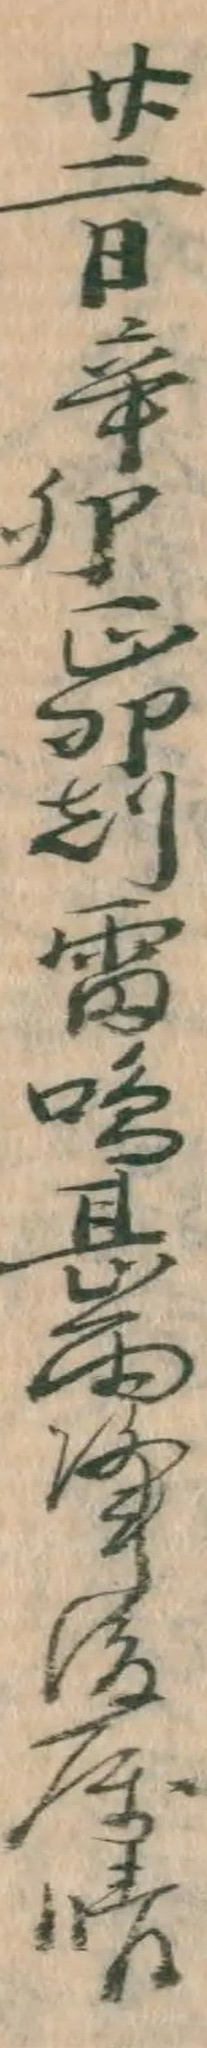廿二日辛卯正卯刻雷鳴甚雨降後属晴
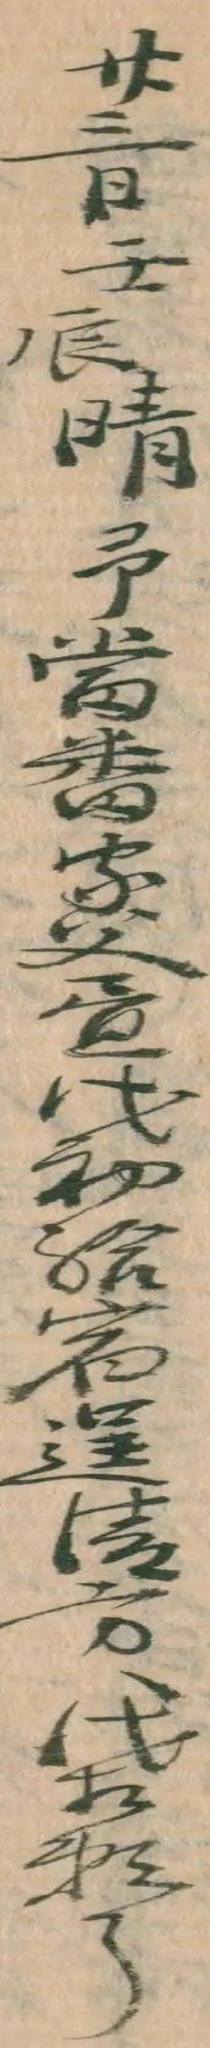廿三日壬辰晴予當番家父昼代勤給宿逞清方へ代相頼了
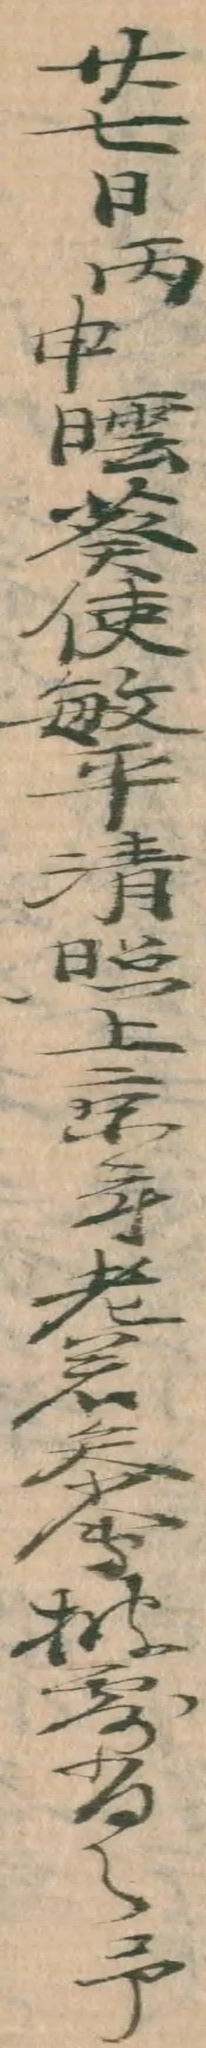廿七日丙申曇葵使敏平清照上京ニ付老若参會披露有之予
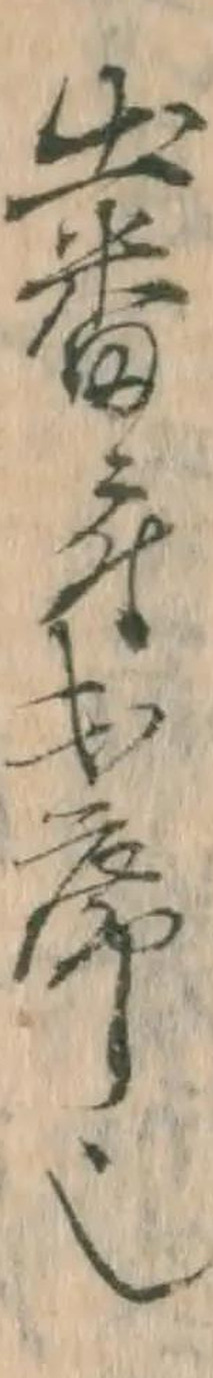出番ニ付出席也
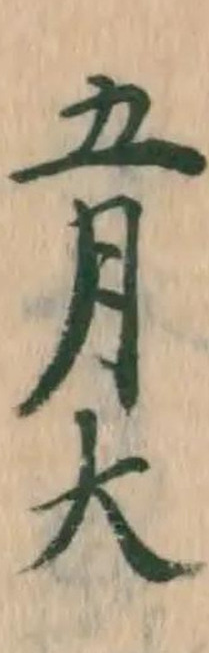五月大
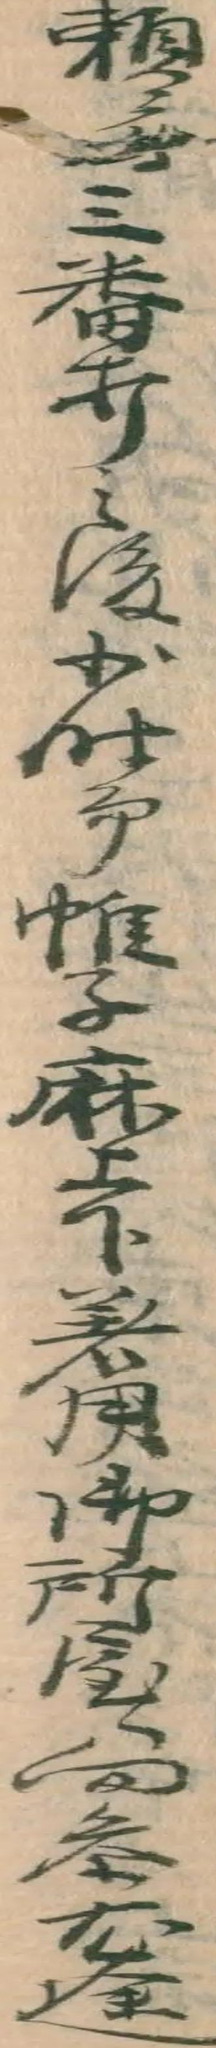頼ニ付三番打之後少時而帷子麻上下着用御所屋へ向参尤途
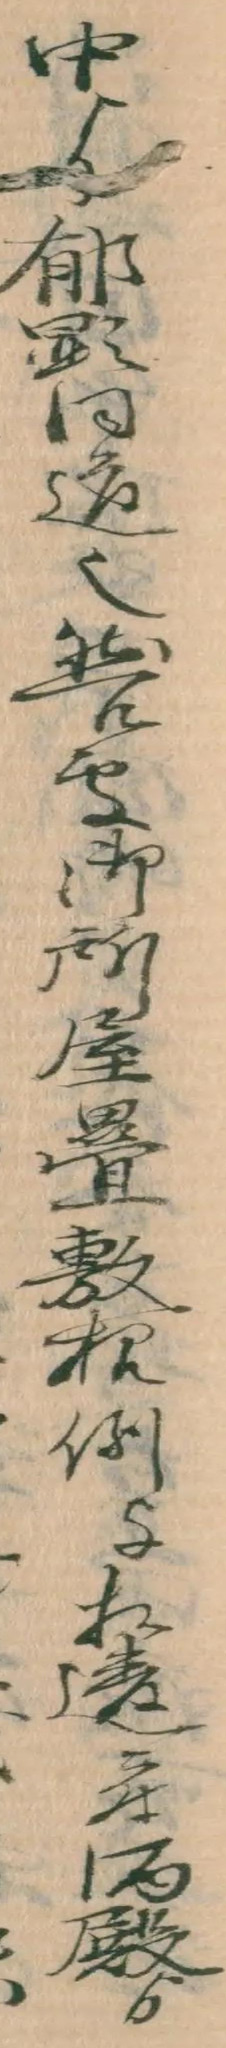中より郁顕同道也然ル處御所屋畳敷様例と相違ニ付酒殿ゟ
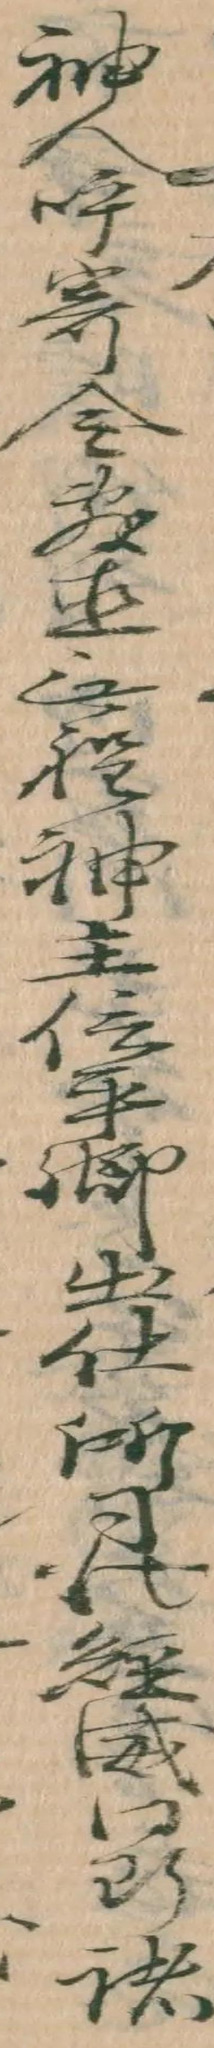神人呼寄令敷直無程神主信平卿出仕所司代経威同断諸
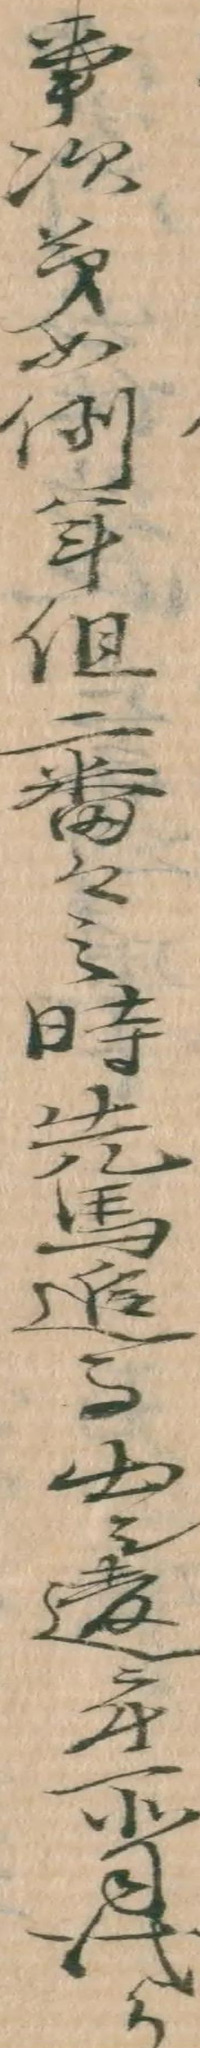事次第如例年但二番々之時先馬追馬出シ違ニ付所司代より
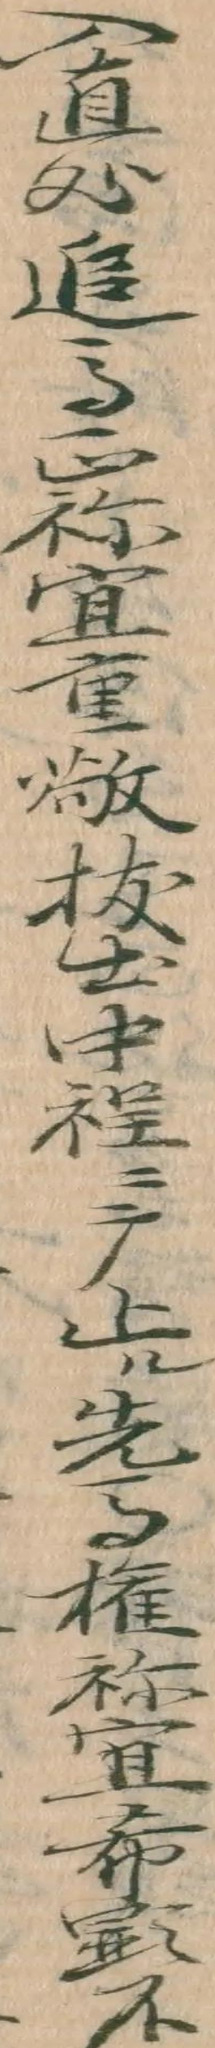入直処追馬正弥宜重敬抜出中程ニテ止ル先馬権祢宜希顕不
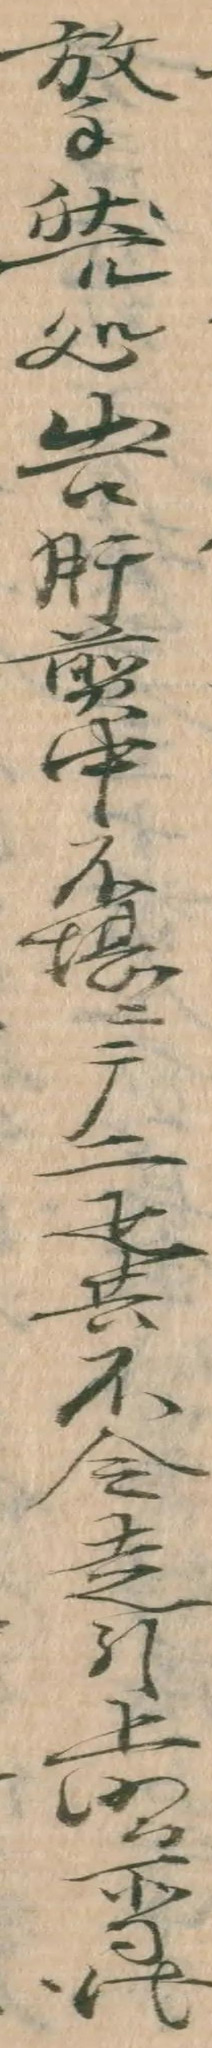放手然ル処出口肝煎中不堪ニテ二疋共不令走引上仍而所司代
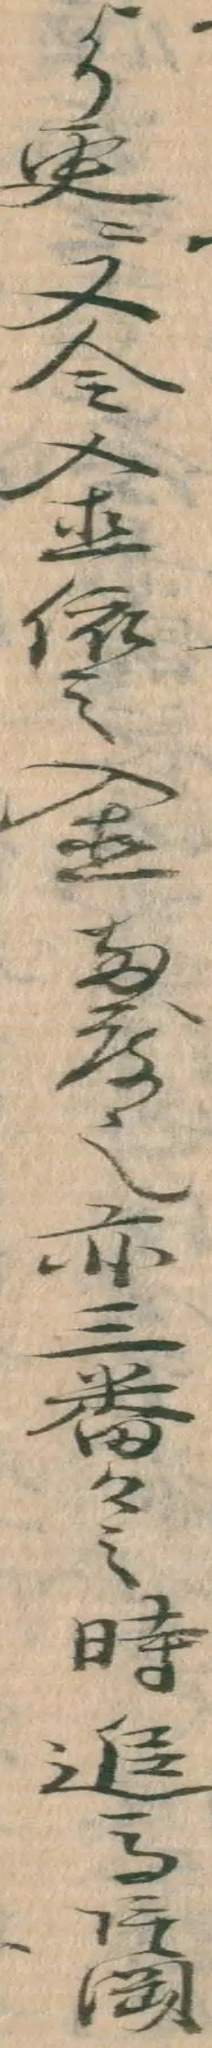より更に又令入直依之入直両度也亦三番々之時追馬片岡
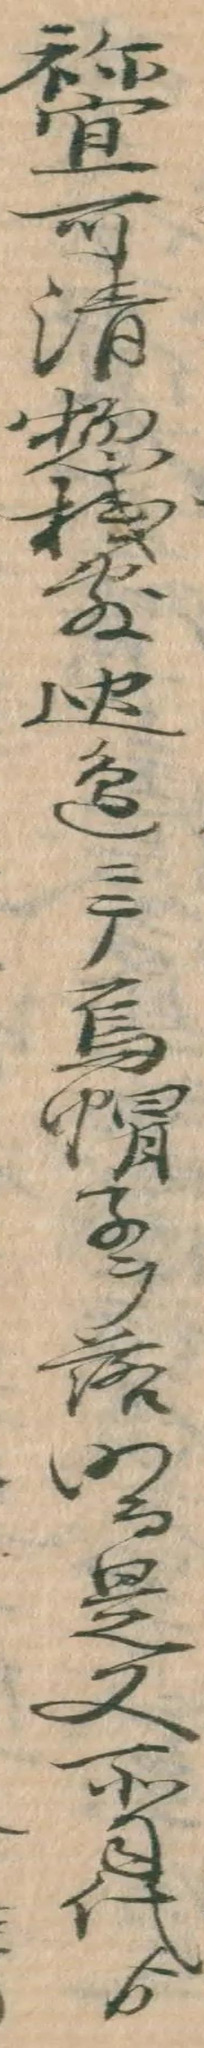祢宜可清惣桟敷過邊ニテ烏帽子ヲ落仍而是又所司代ゟ
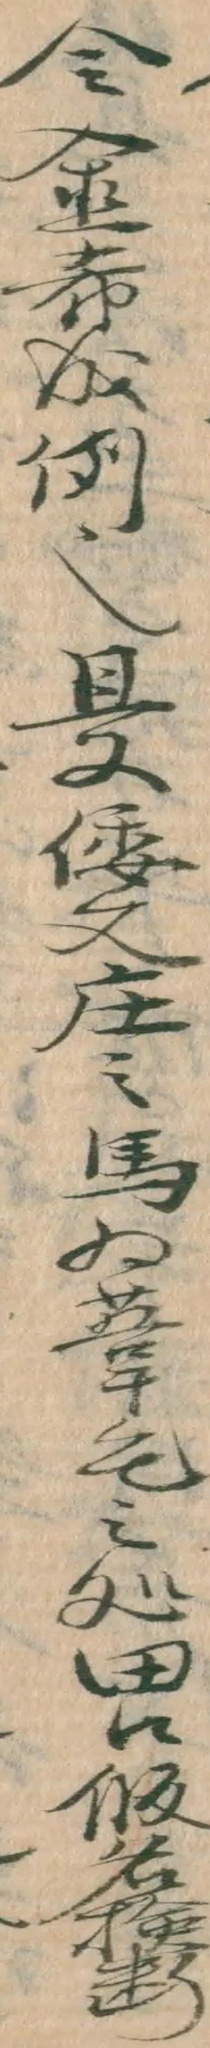令入直希成例也且又倭文庄之馬為葦毛之処田口假名検断
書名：賀茂社記録. 第65冊
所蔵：国立国会図書館 National Diet Library, JAPAN
